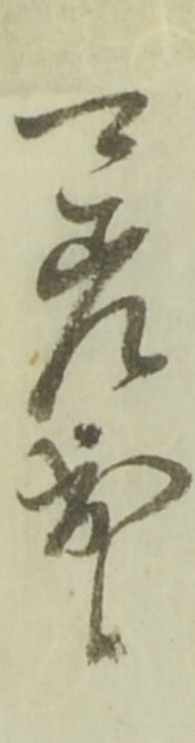可差出候
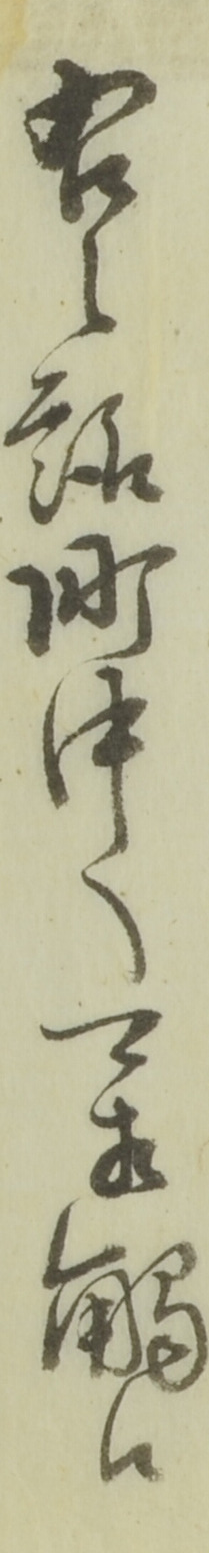右之趣町中へ可相触候
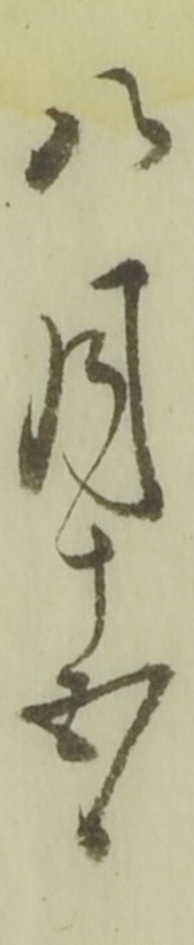八月十五日
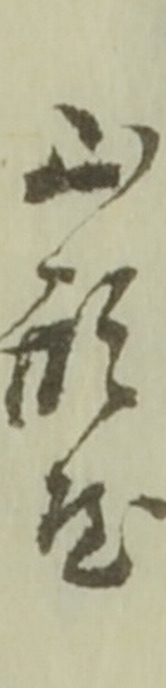山形屋
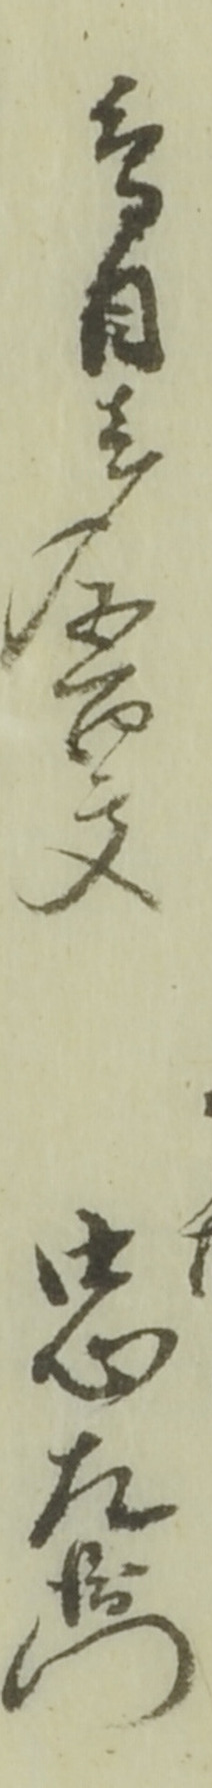鳥目壱貫五百文忠左衛門
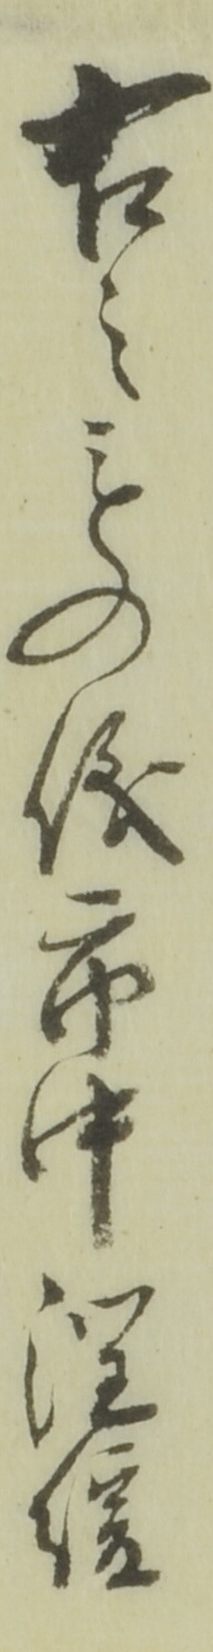右之もの儀市中潤
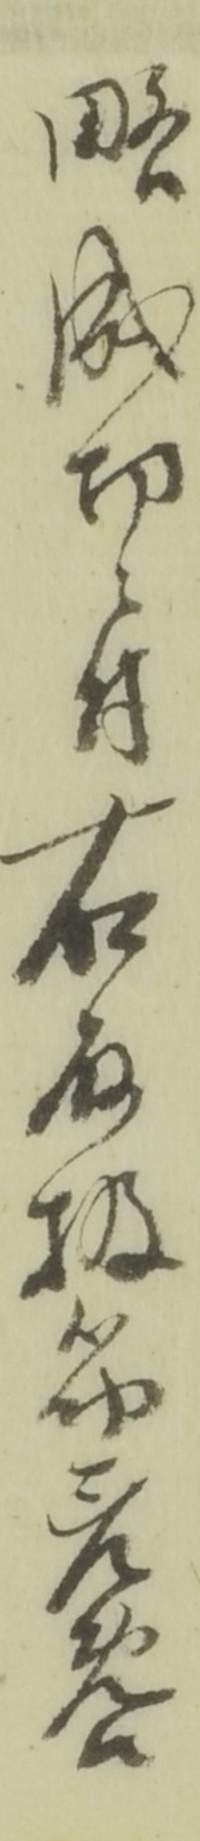略成切ニ付右取扱筋差免候
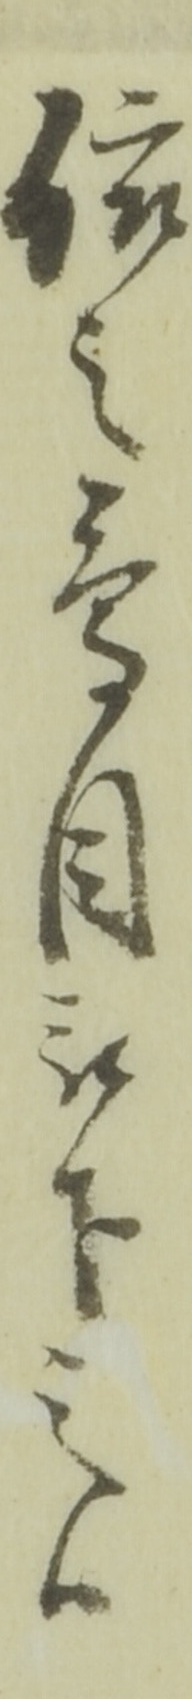依之鳥目被下之候
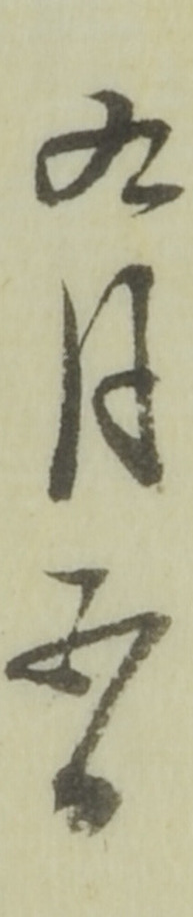九月五日
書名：御触書御書附控帳
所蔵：伊那市立高遠町図書館・合同会社AMANE
